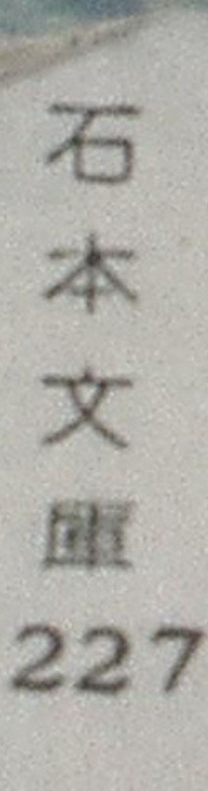石本文庫

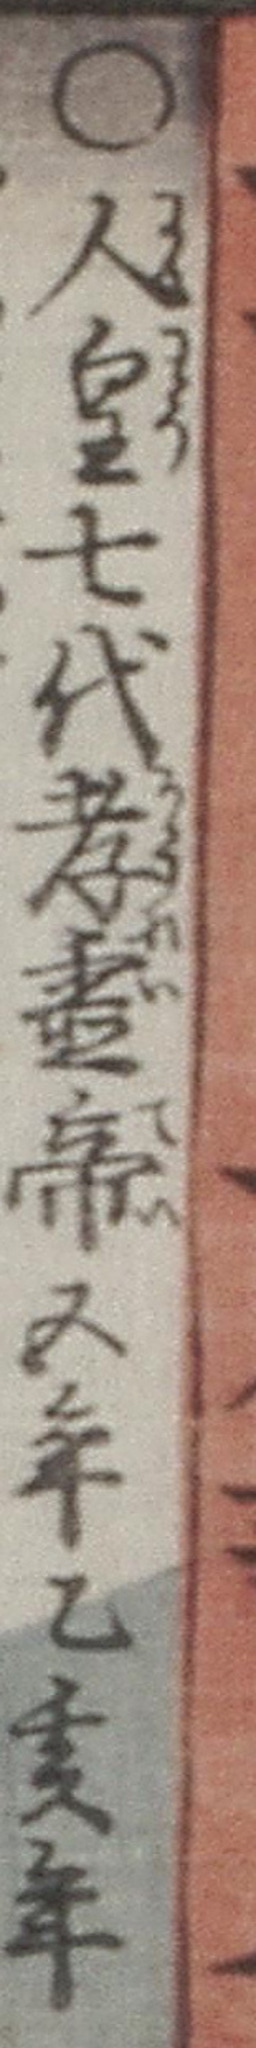◯人皇七代孝霊帝五年乙亥年
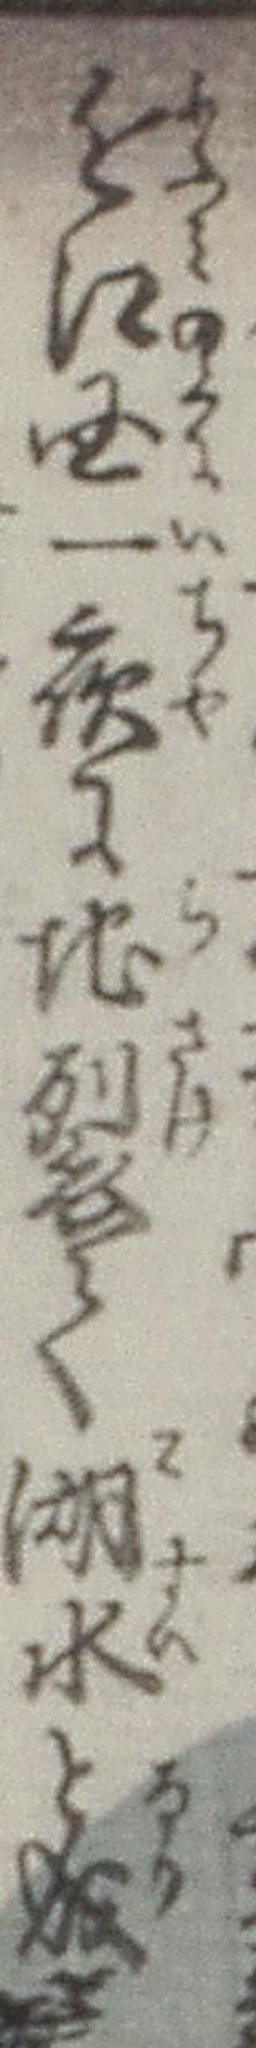近江国一夜に地裂て湖水と成
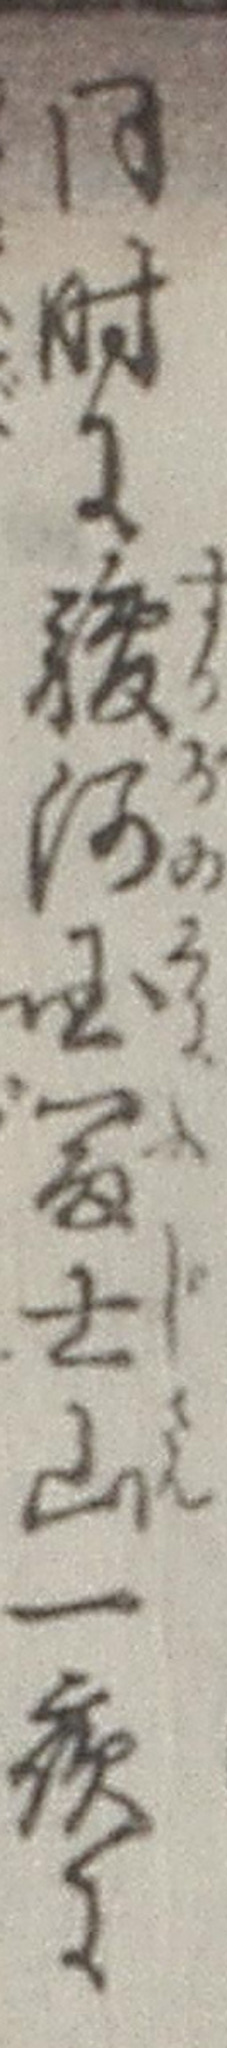同時に駿河国富士山一夜に
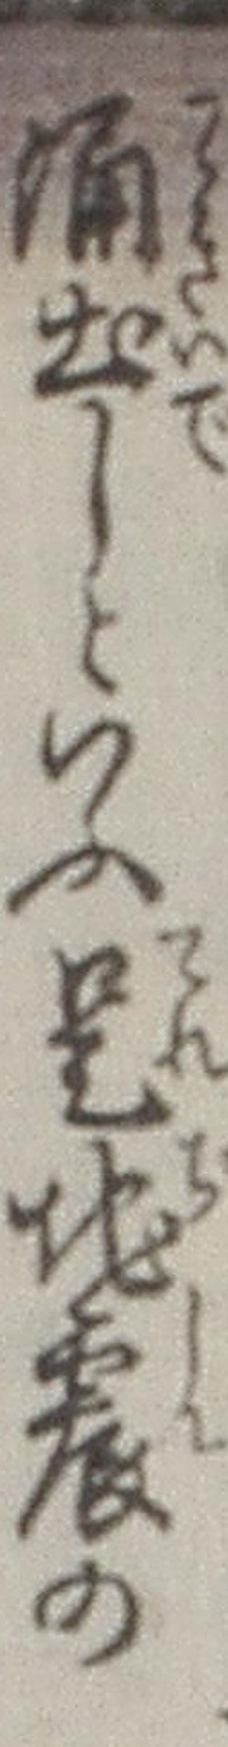湧出しといふ是地震の
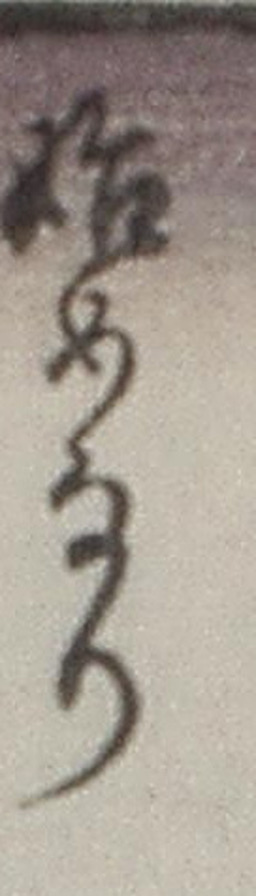始めなり
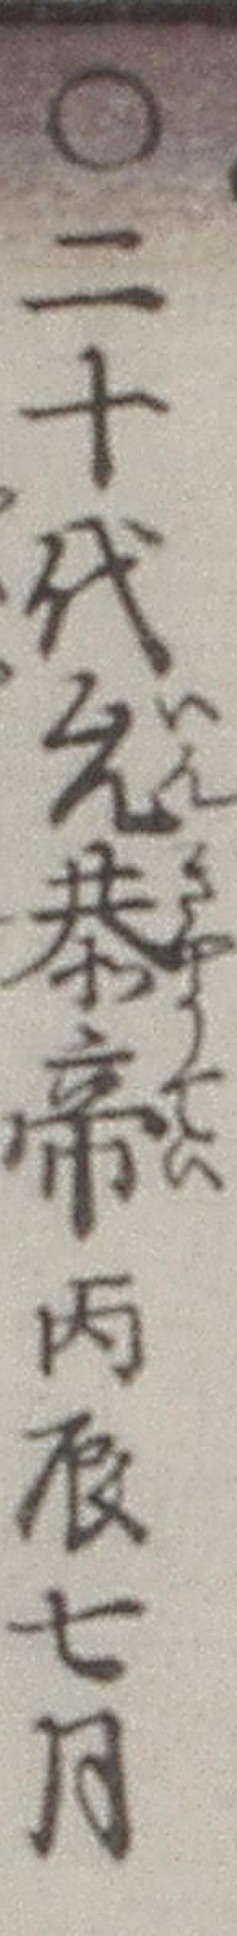◯二十代允恭帝丙辰七月
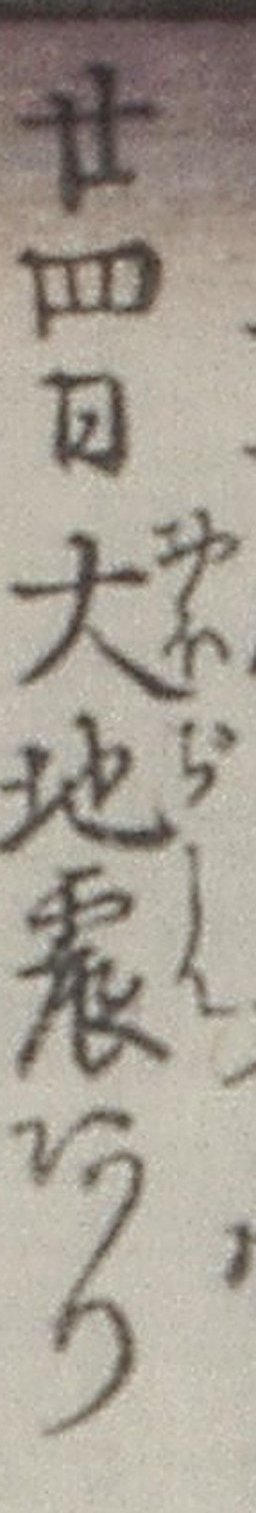廿四日大地震あり
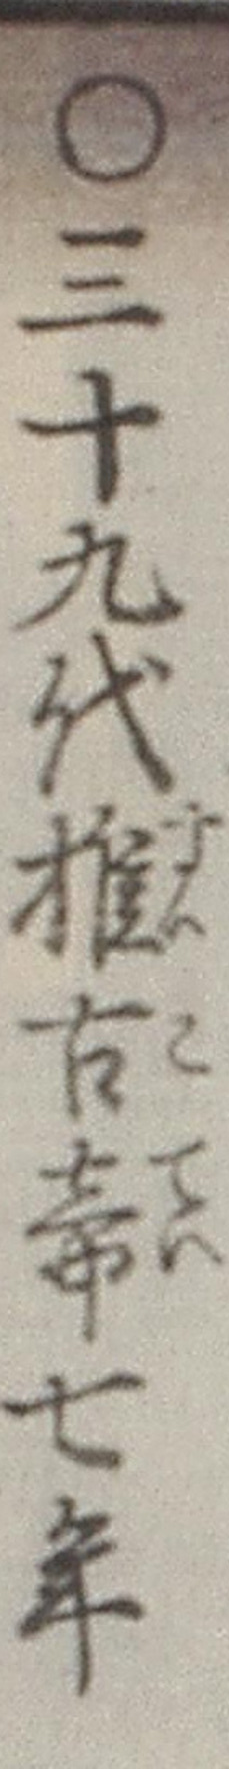◯三十九代推古帝七年
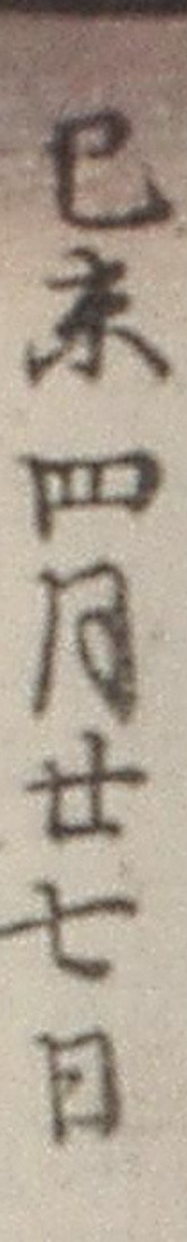己未四月廿七日
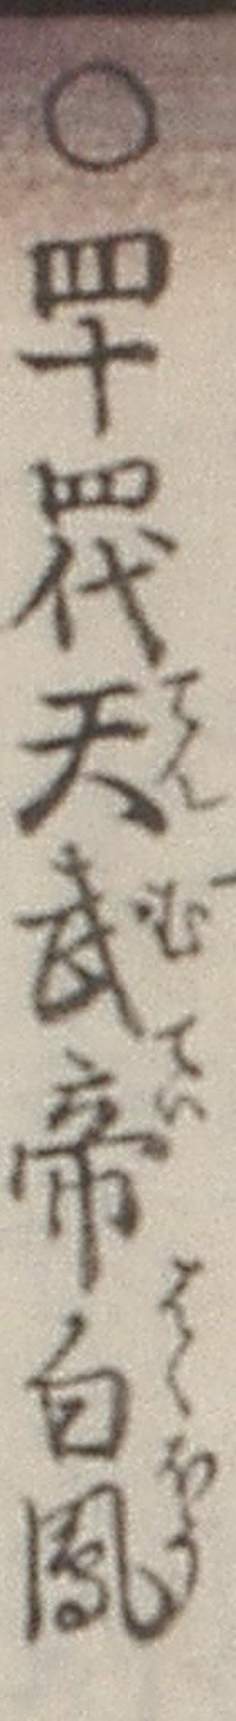◯四十四代天武帝白鳳
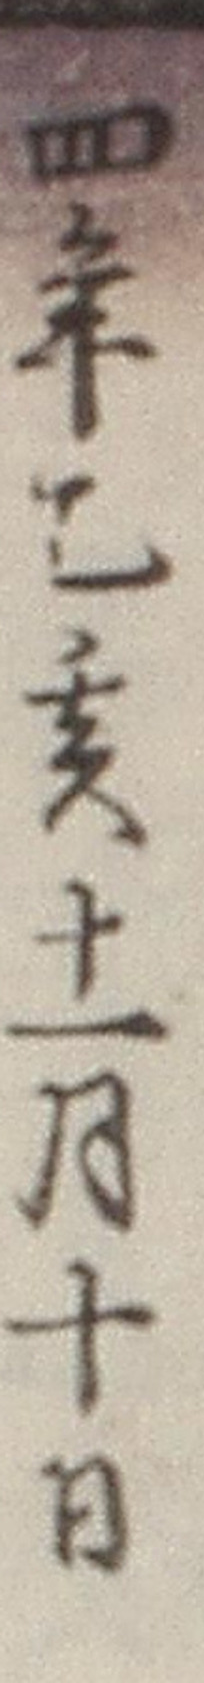四年乙亥十一月十日
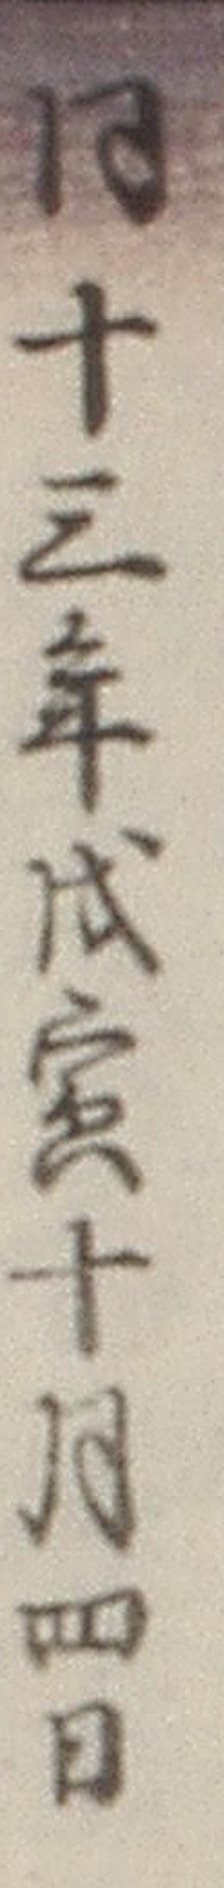同十三年戊寅十月四日
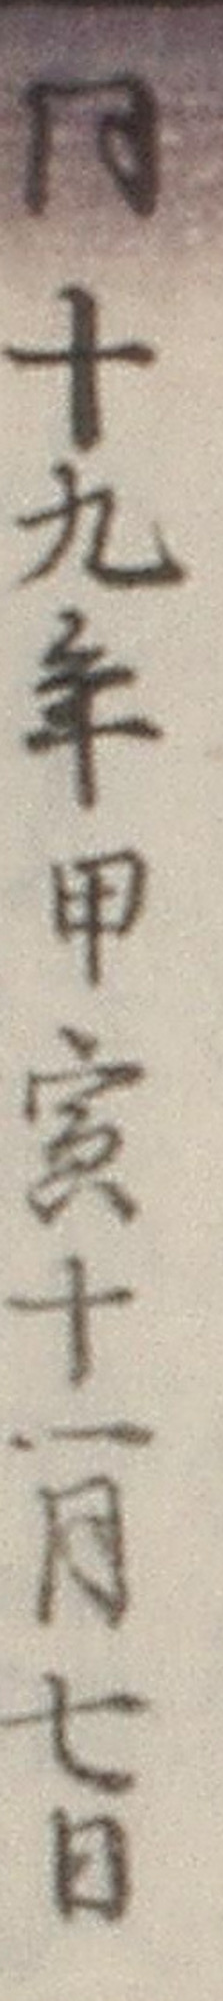同十九年甲寅十一月七日
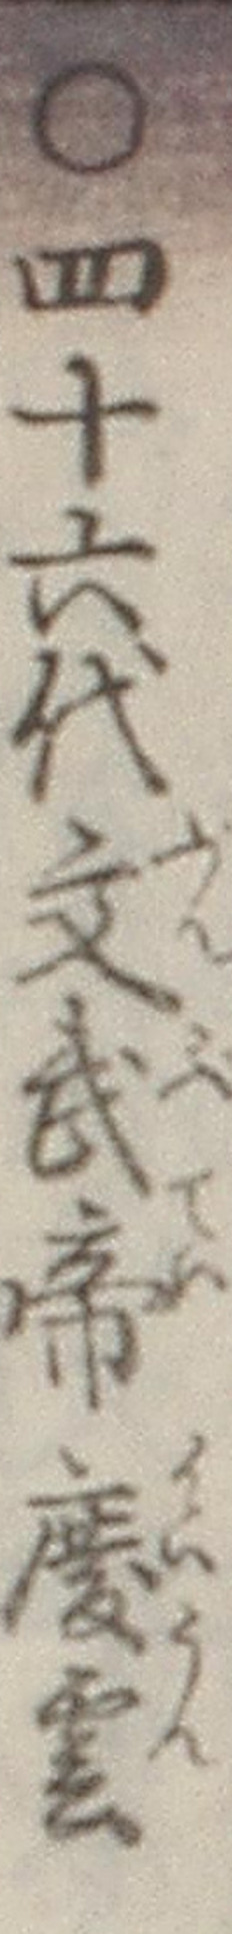◯四十六代文武帝慶雲
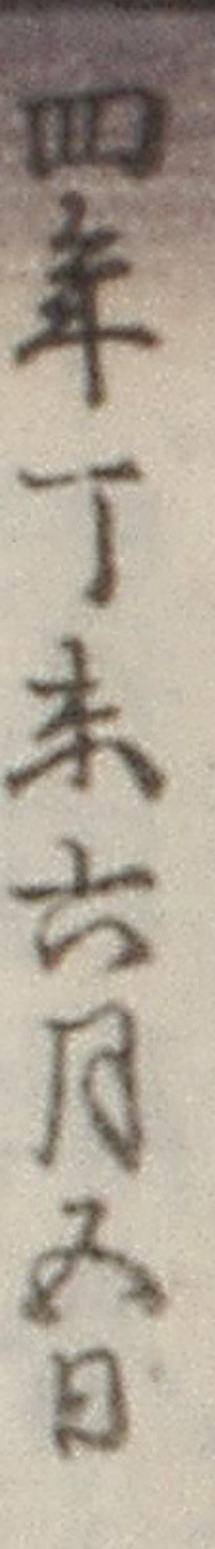四年丁未六月五日
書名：諸國大地震年代記　末代噺種
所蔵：東京大学地震研究所図書室 Earthquake Research Institute Library, The University of Tokyo, JAPAN
